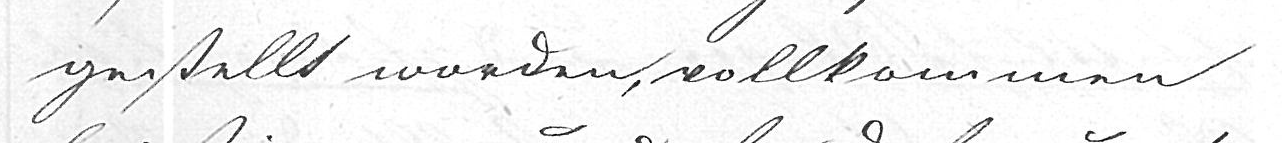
gestellt worden, vollkommen
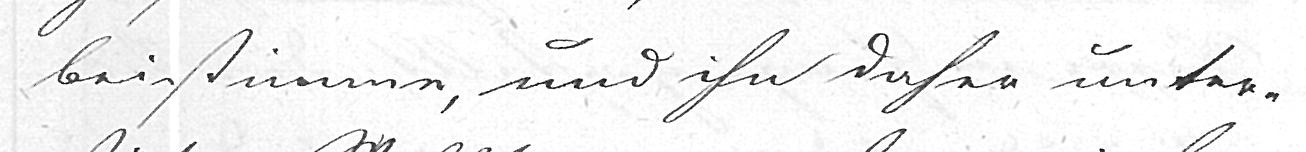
beistimme, und ihn daher unter-
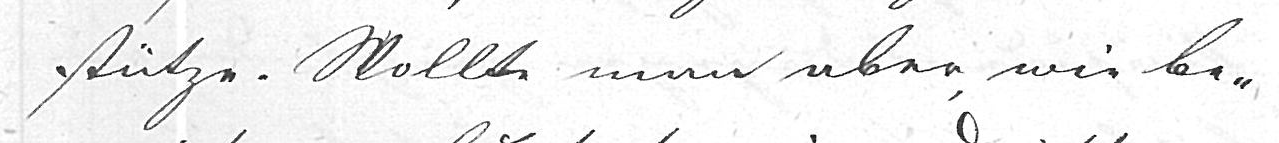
stütze. Sollte man aber, wie be-
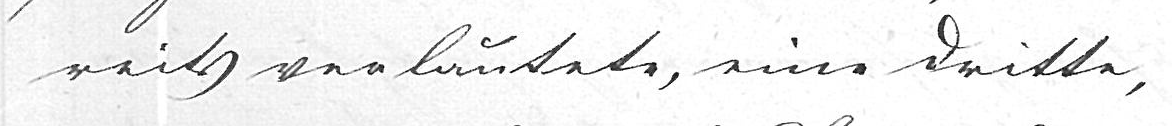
reits der lautete, eine dritte,
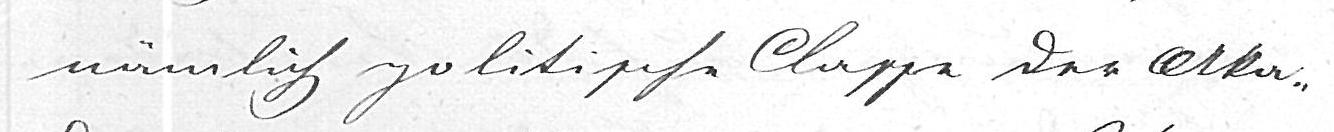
nämlich politische Classe der Aka-
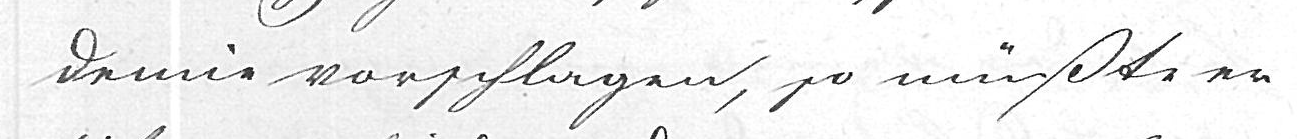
demie vorschlagen, so müßte er
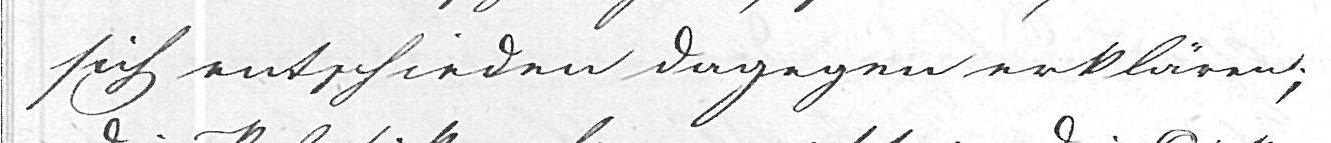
sich entschieden dagegen erklären;
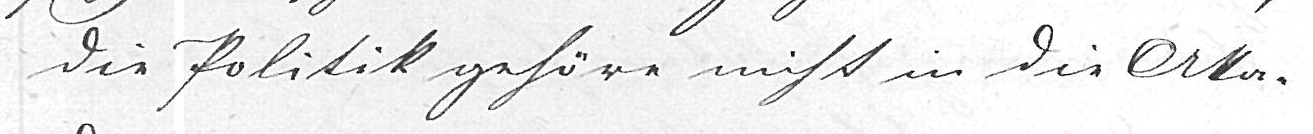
die Politik gehöre nicht in die Aka-
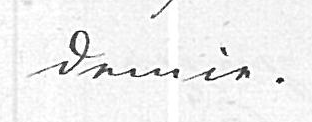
demie.
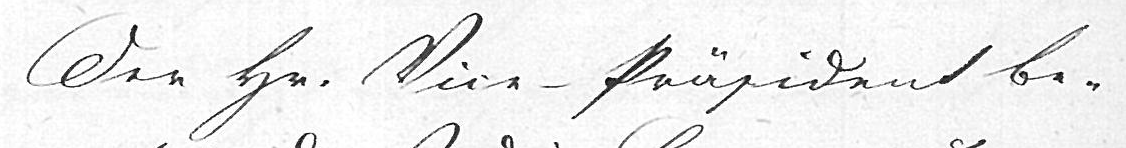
Der Hr. Vice-Präsident be-
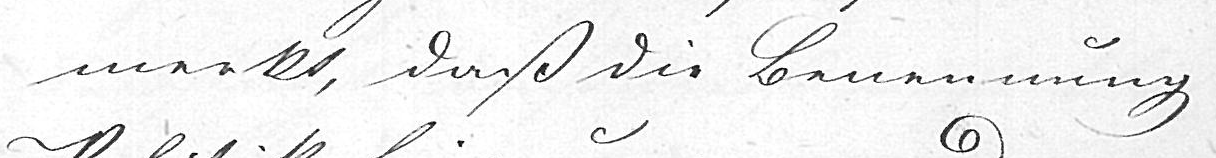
merkt, daß die Benennung
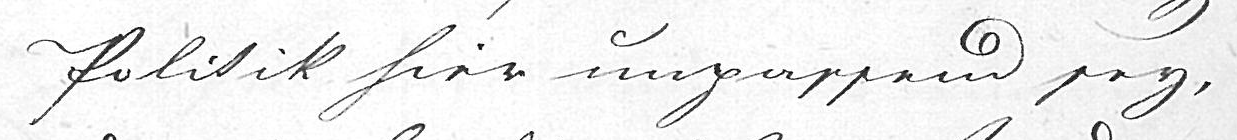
Politik hier unpassend sey,
